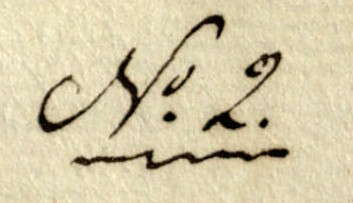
Nº 2.
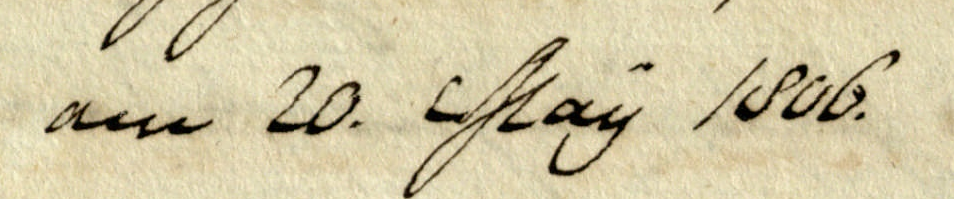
am 20. Maÿ 1806.
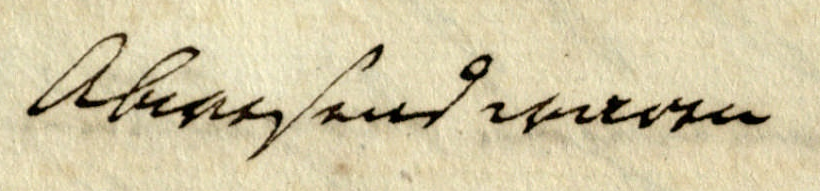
Abwesend waren
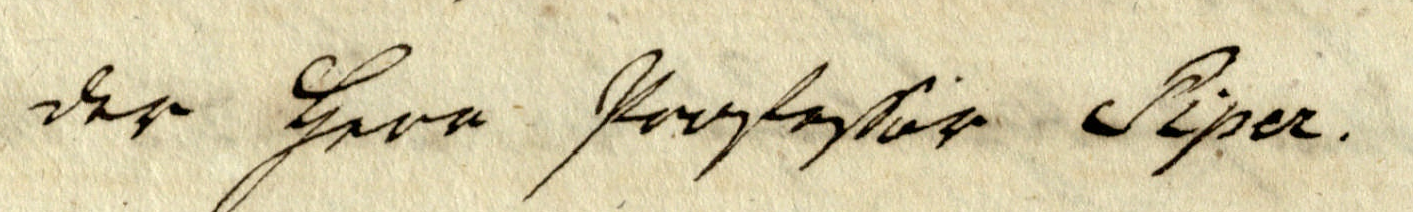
der Herr Professor Piper.
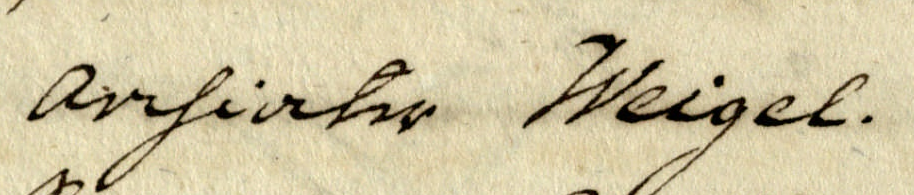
Archiater Weigel.
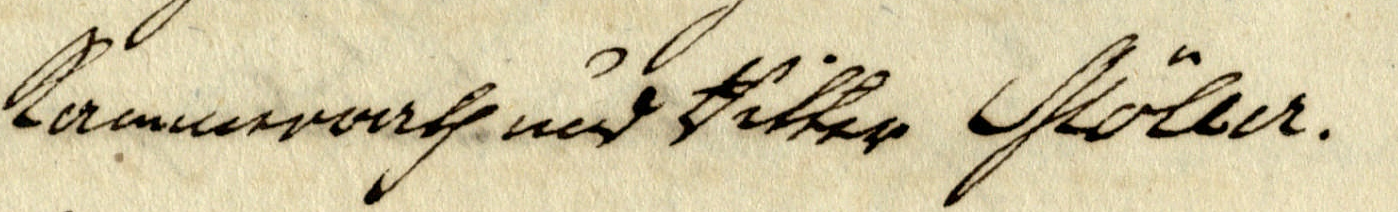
Kammerrath und Ritter Möller.
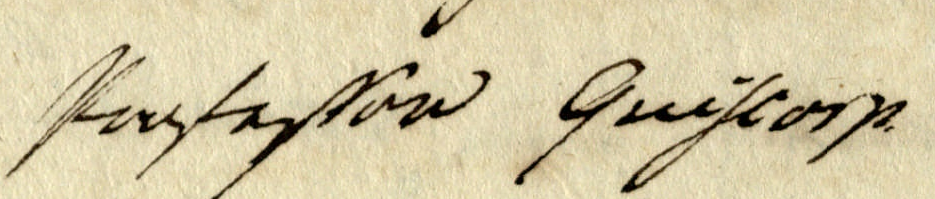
Professor Quistorp
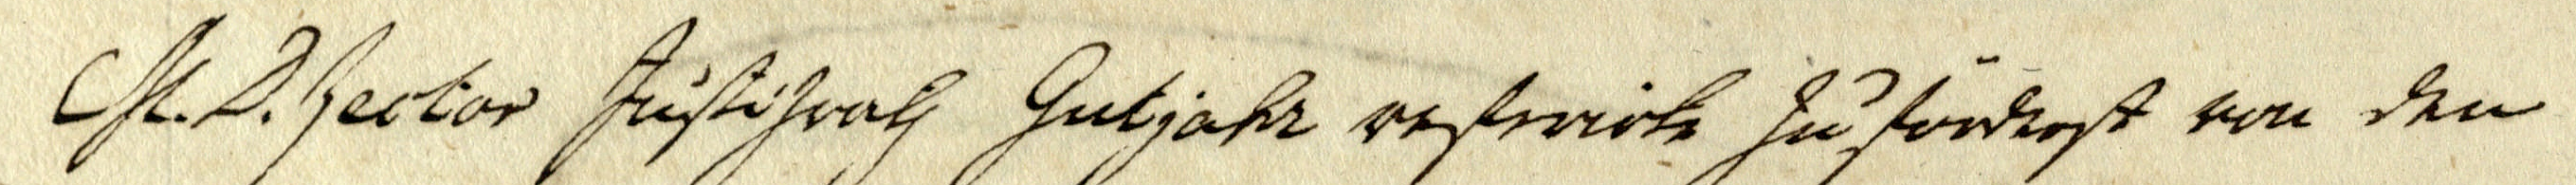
M. D. Rector Justizrath Gutjahr referirte zuförderst von den
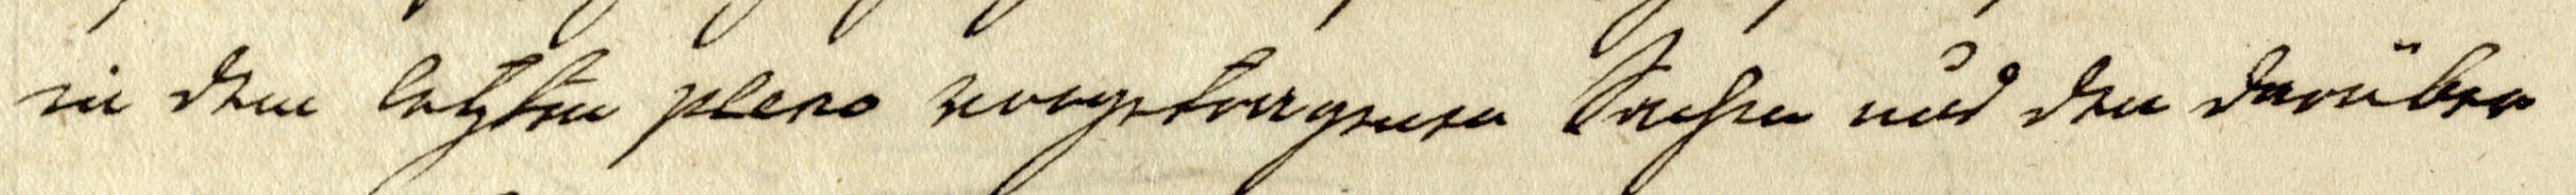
in dem letzten pleno vorgetragenen Sachen und den darüber
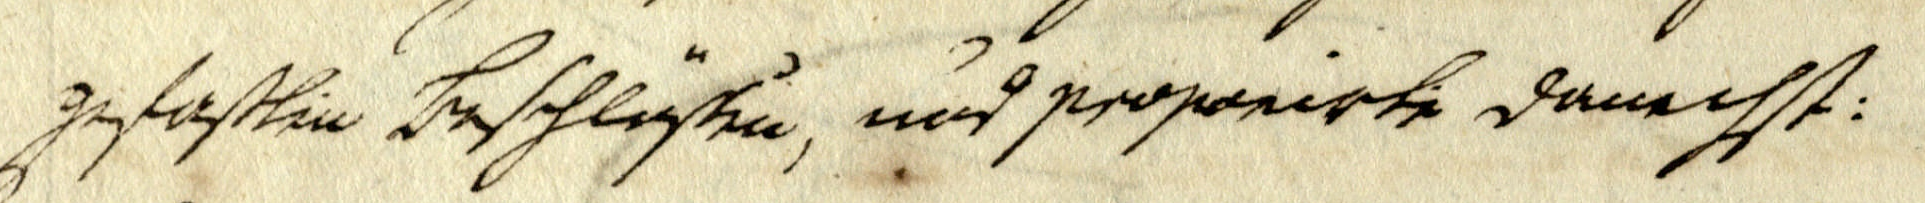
gefaßten Beschlüssen, und proponirte danechst:
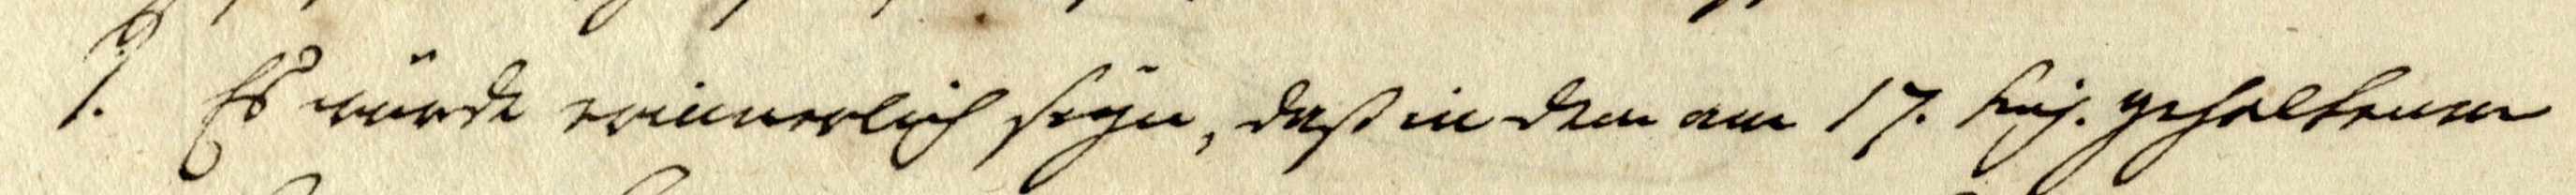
1. Es würde erinnerlich seÿn, daß in dem am 17. huj. gehaltenen
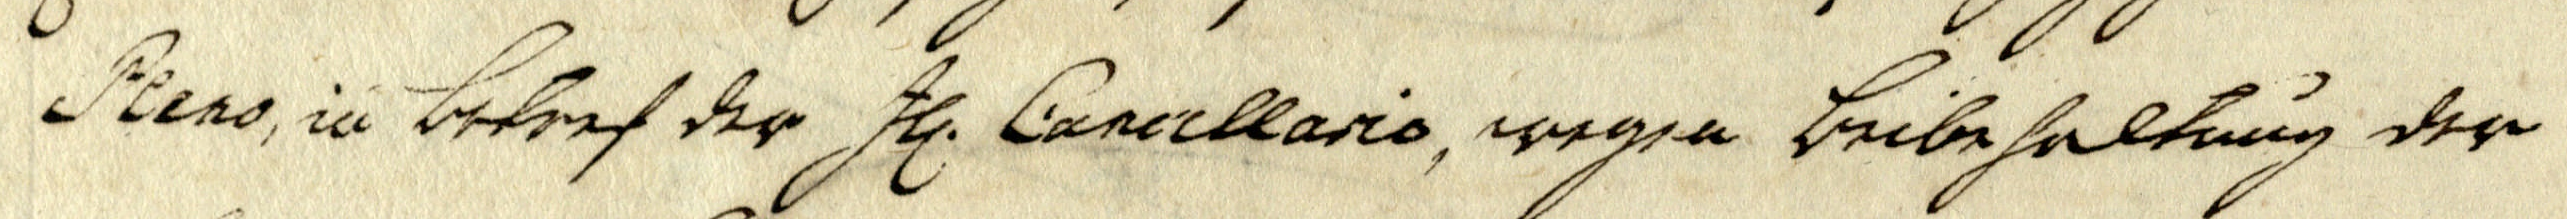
Pleno, in Betref der Ill. Cancellario, wegen Beibehaltung der
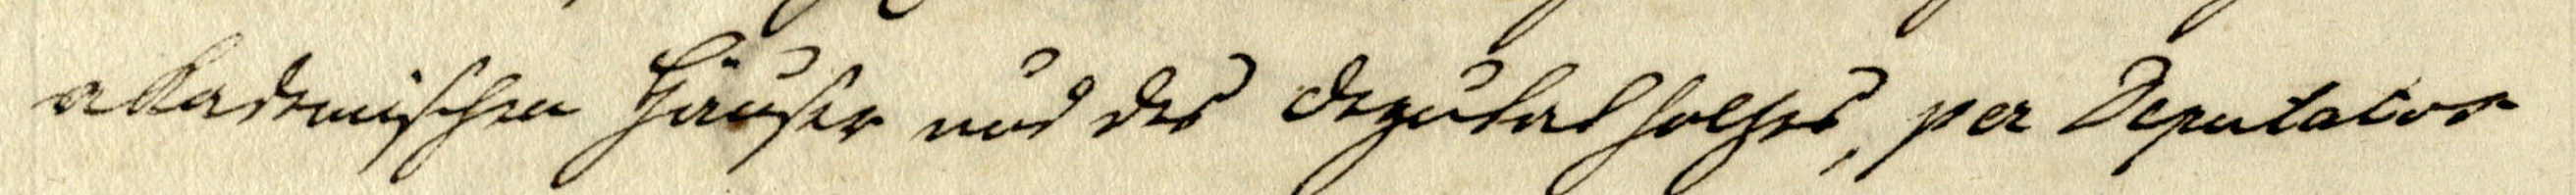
akademischen Häuser und des Deputatholzes, per Deputatos
